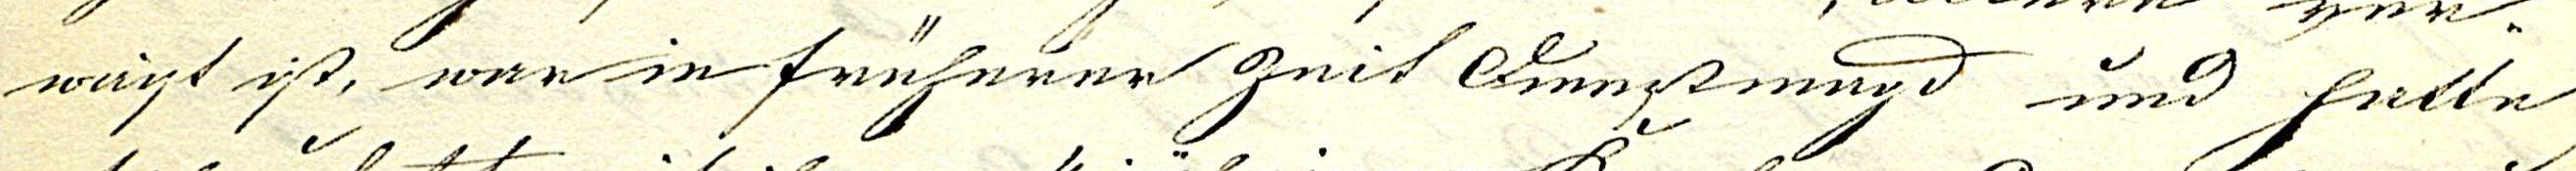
waist ist, war in früherer Zeit Dienstmagd und hatte
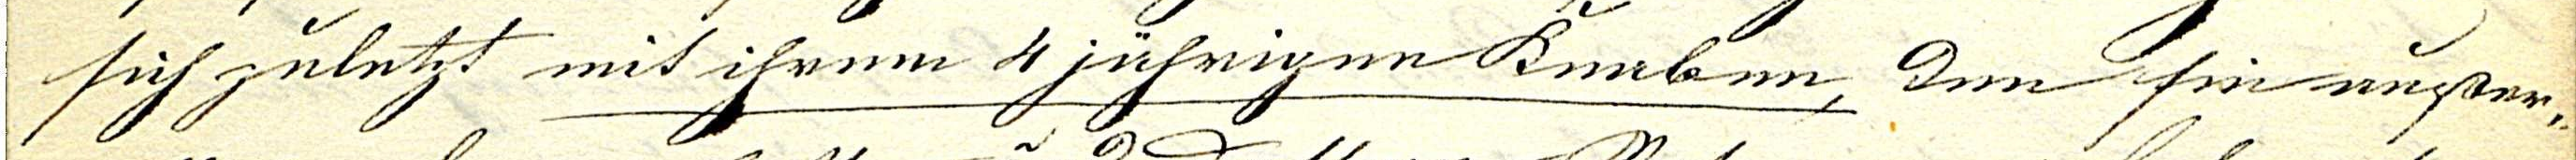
sich zuletzt mit ihrem 4jährigen Knaben, den sie auße¬
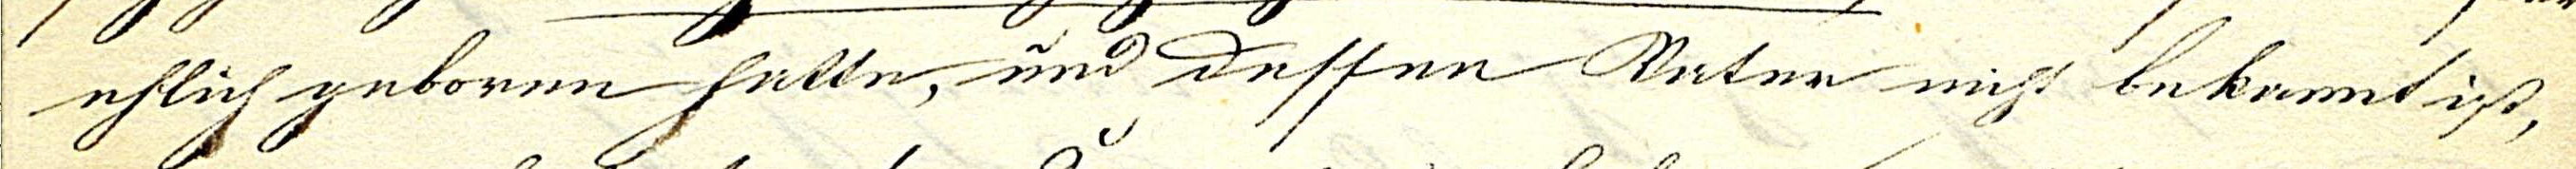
helich geboren hatte, und dessen Vater nicht bekannt ist,
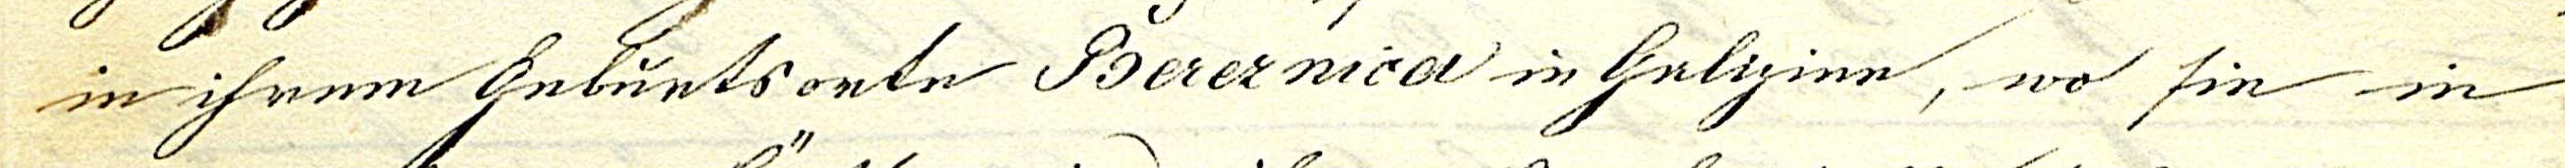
in ihrem Geburtsorte Bereznica in Galizien, wo sie in
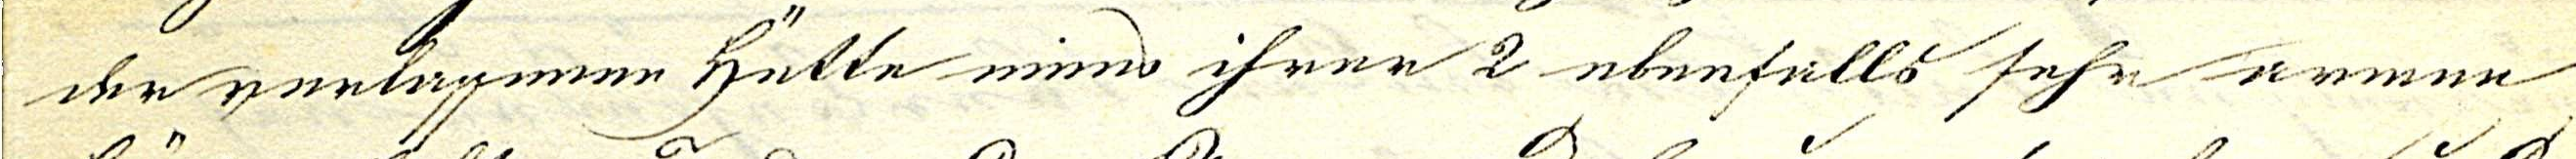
der verlassener Hütte eines ihrer 2 ebenfalls sehr armen
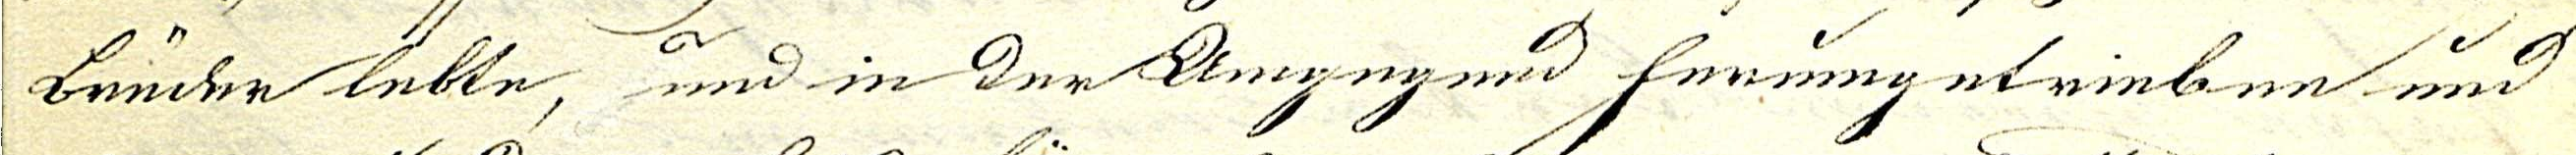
Brüder lebte, und in der Umgegend herumgetrieben und
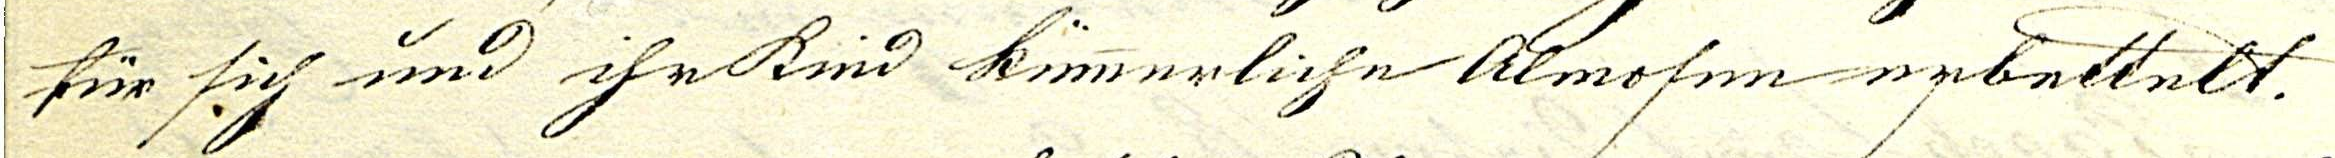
für sich und ihr Kind kümmerliche Almosen erbettelt.
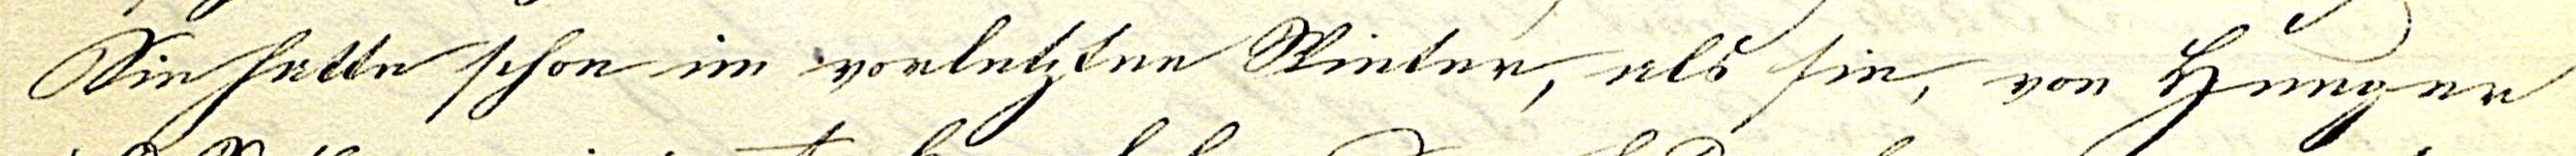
Sie hatte schon im vorletzten Winter, als sie, von Hunger
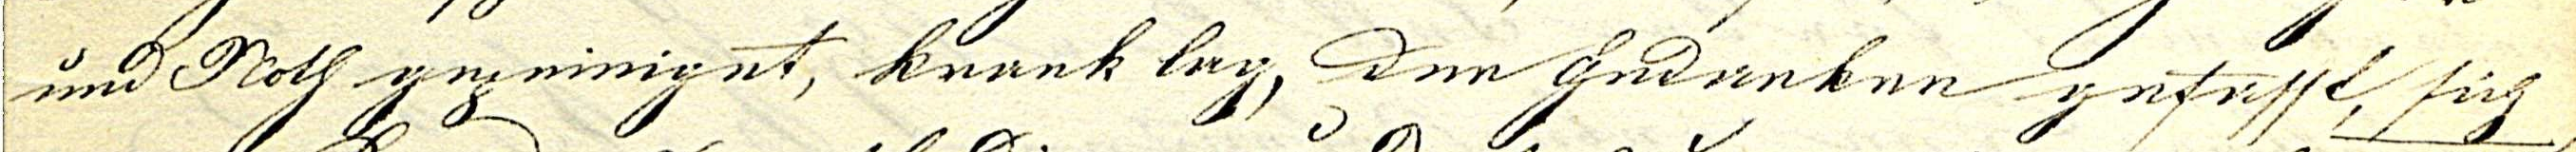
und Noth gepeiniget, krank lag, der Gedanken gefasst, sich
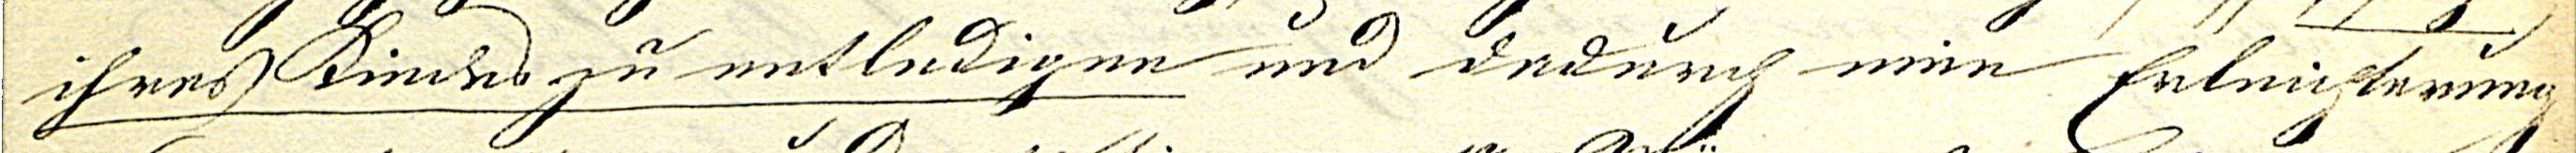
ihres Kindes zu entledigen und dadurch eine Erleichterung
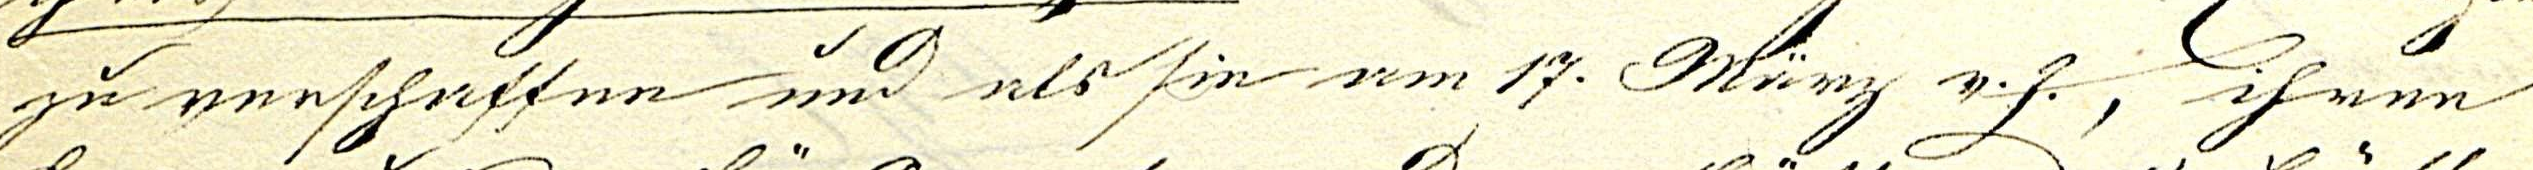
zu verschaffen und als sie am 17. März v. J. ihren
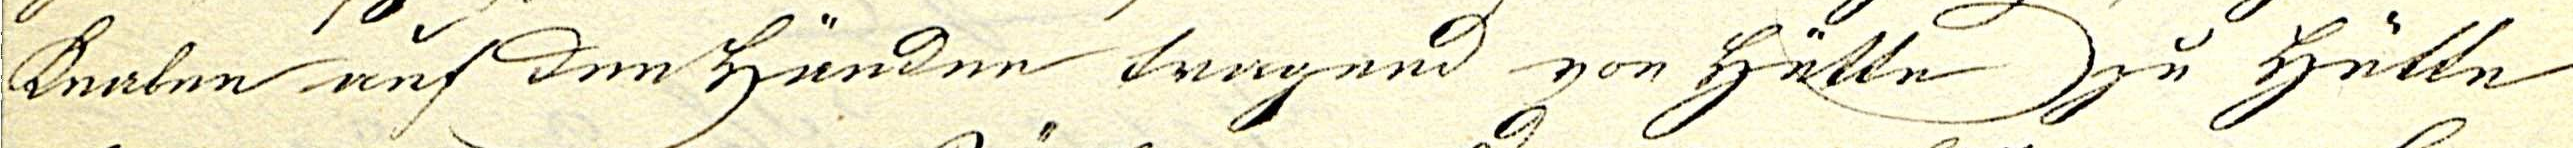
Knaben auf dem Händen tragend von Hütte zu Hütte
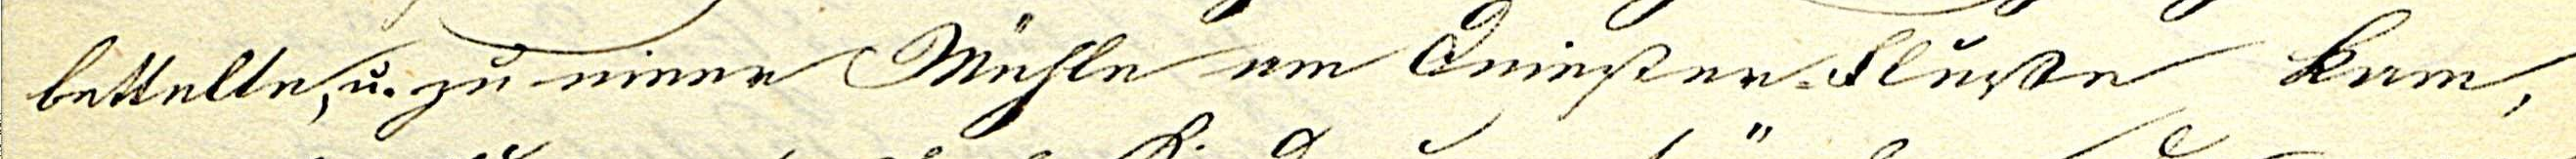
bettelte, u. zu einer Mühle am Dniester-Fluße kam,
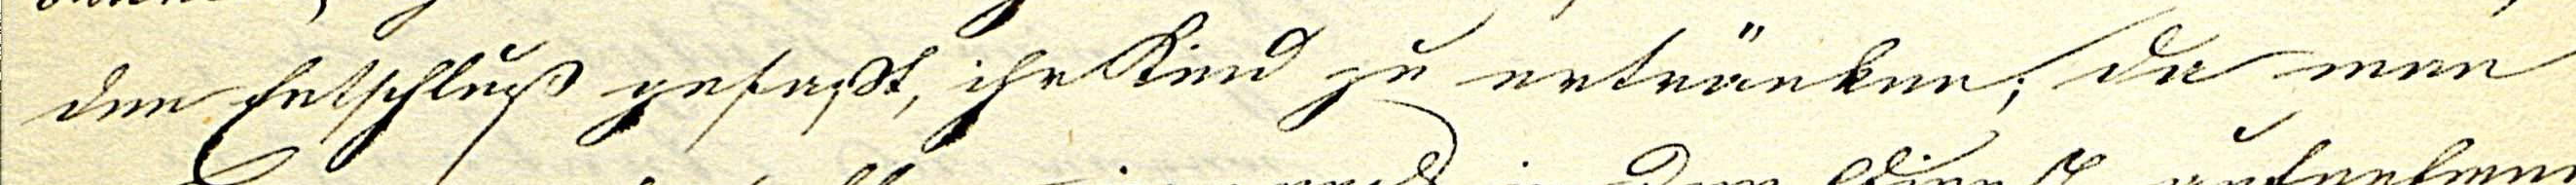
den Entschluß gefaßt ihr Kind zu ertränken; da man
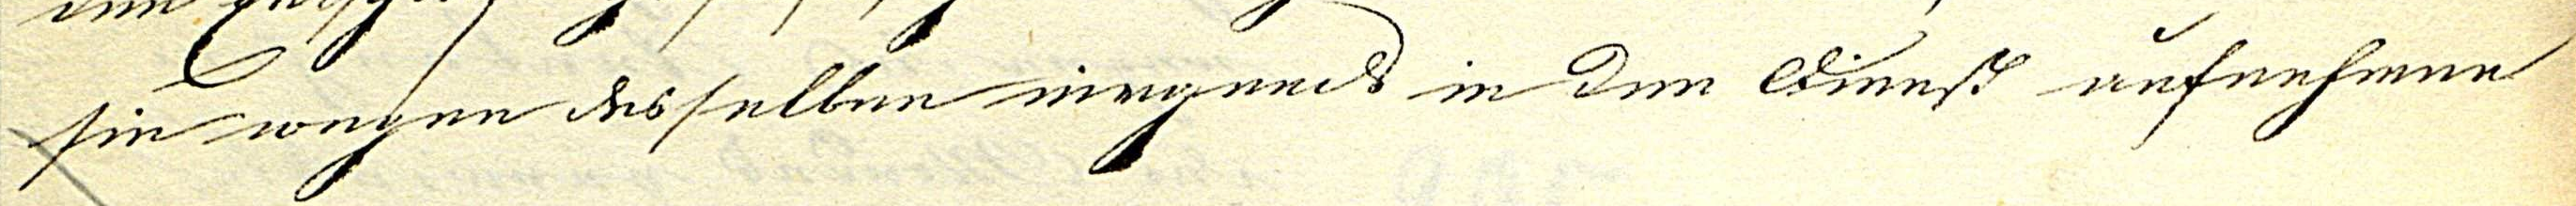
sie wegen desselben nirgends in den Dienst aufnehmen
